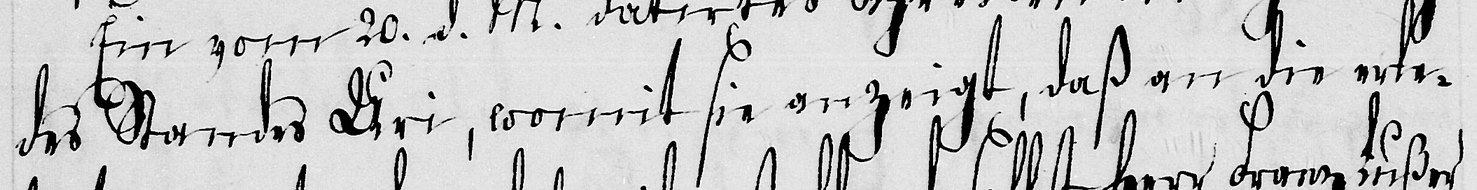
des Standes Uri, womit sie anzeigt, daß an die erle¬
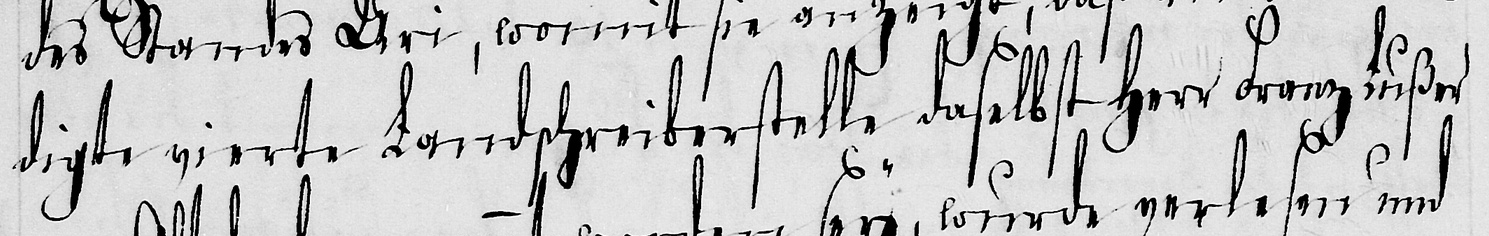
digte vierte Landschreiberstelle daselbst Herr Franz Lußer
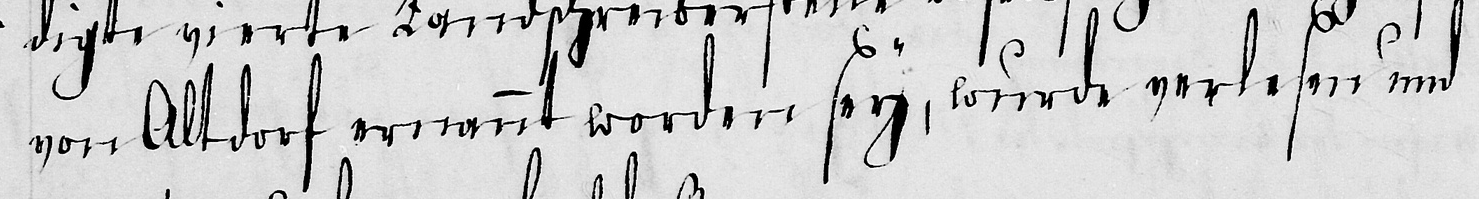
von Altdorf ernannt worden sey, wurde verlesen und
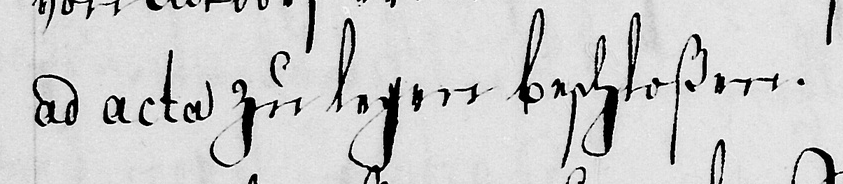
ad acta zu legen beschloßen.
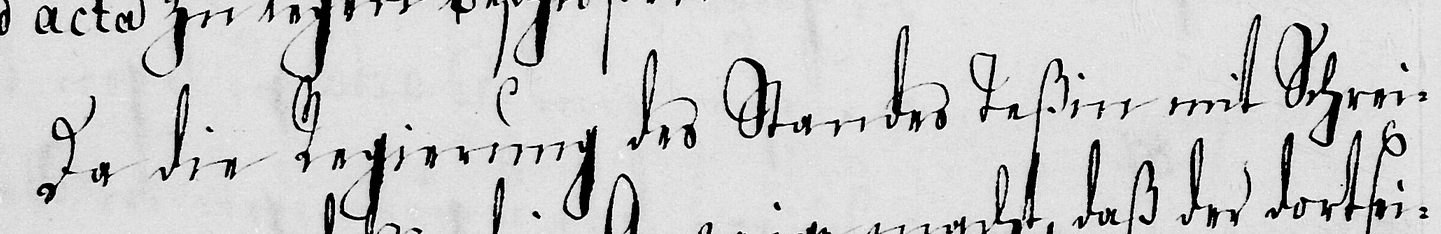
Da die Regierung des Standes Teßin mit Schrei¬
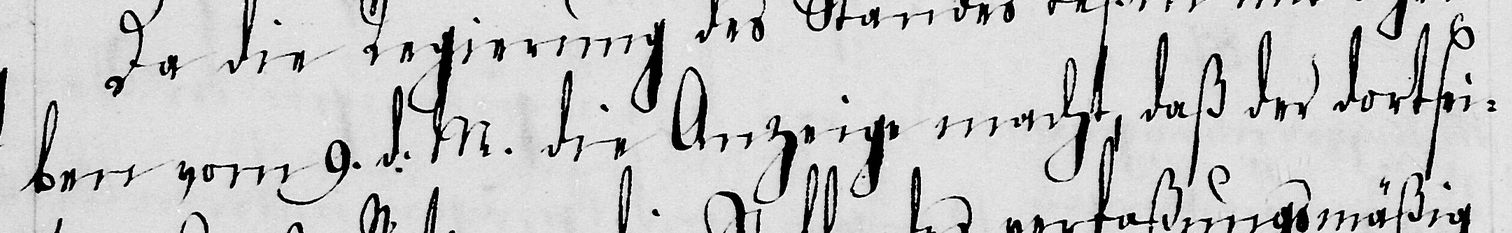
ben vom 9. d. M. die Anzeige macht, daß der dortsei¬
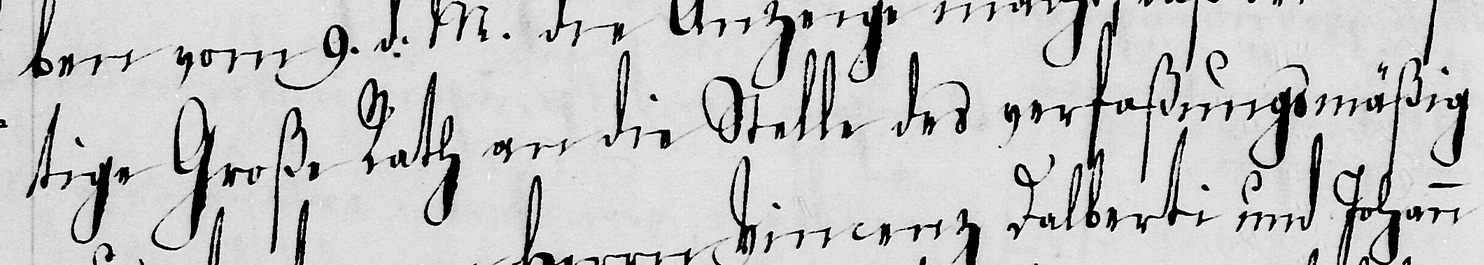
tige Große Rath an die Stelle des verfaßungsmäßig
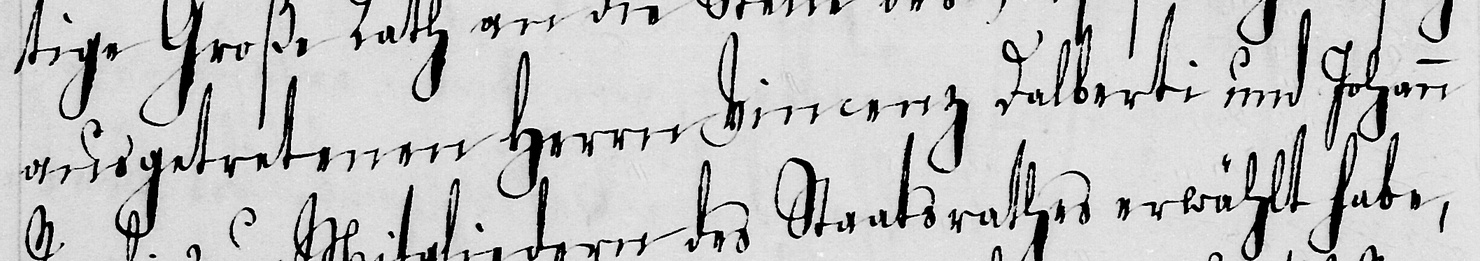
ausgetretenen Herrn Vincenz Dalberti und Johann
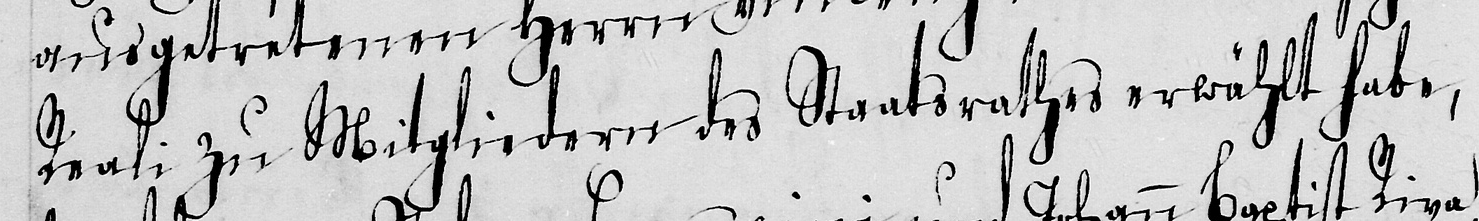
Reali zu Mitgliedern des Staatsrathes erwählt habe,
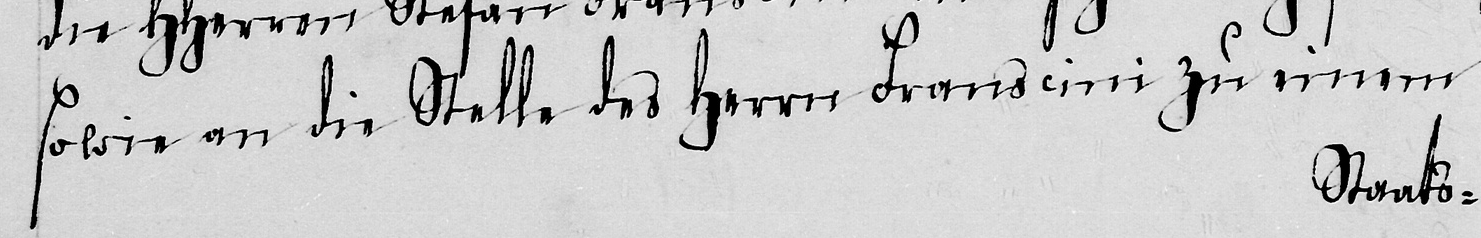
sowie an die Stelle des Herrn Franscini zu einem
